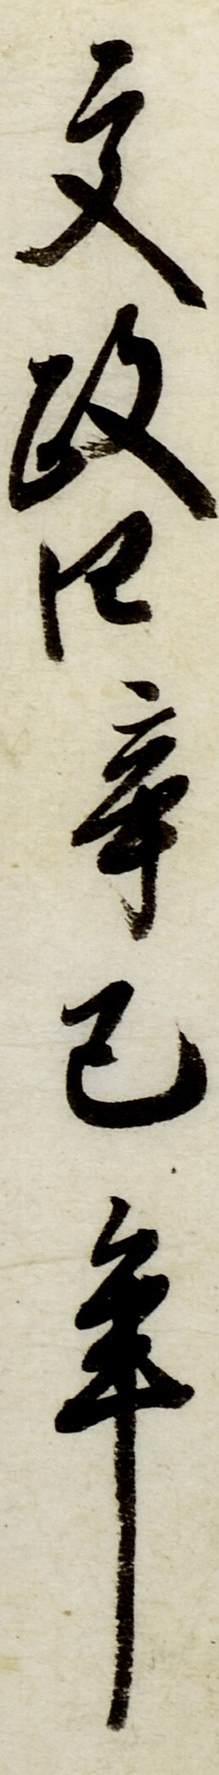文政四辛巳年
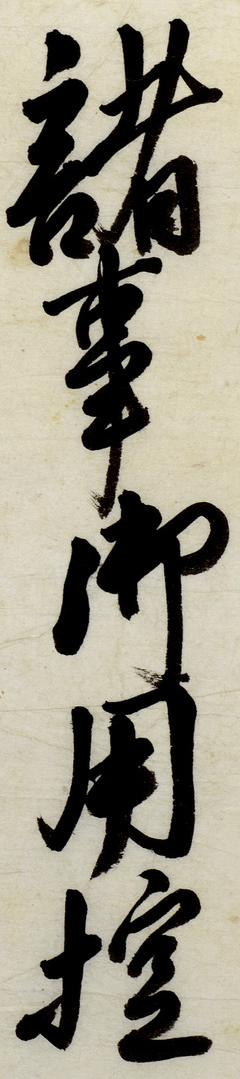諸事御用控
